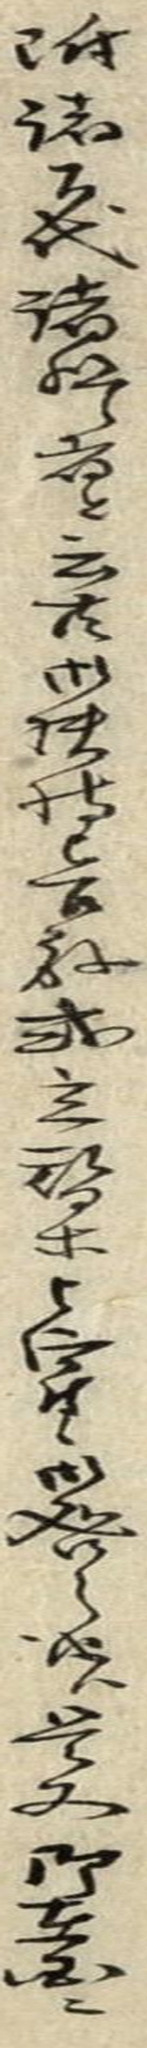附諸下代諸組之者と云共御扶持被召放或立替等被仰付候御咎之儀は是又御在国に
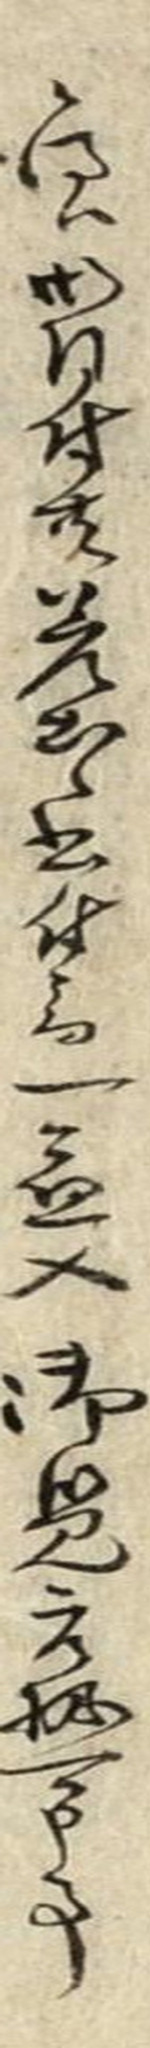候得は御目付共差出候書付に而一応入御覧取扱可申事
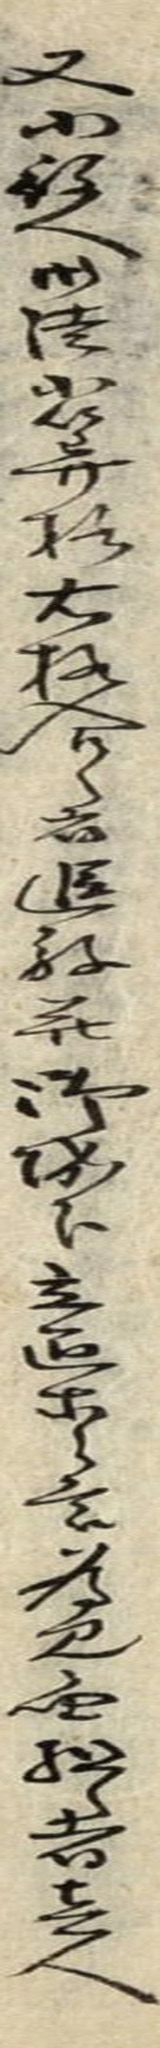又小役人御徒小算格右格合之者追放并御城下立退等之節為見届組之者壱人
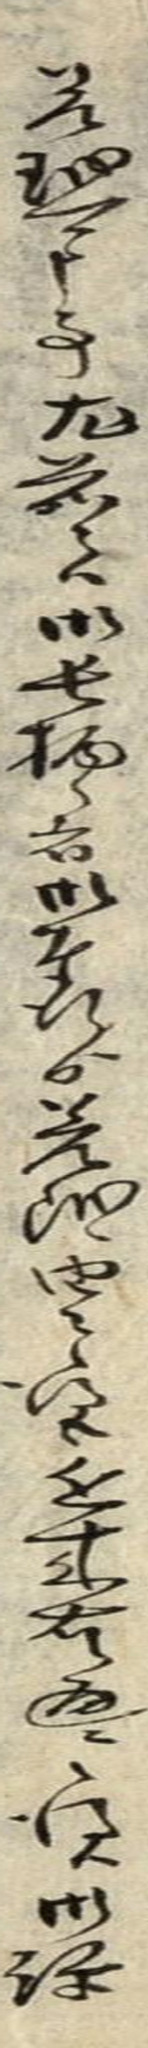差越可申事尤前々は御長柄之者御奉行ゟ差越候由に候得共近来右之通に候得は御評
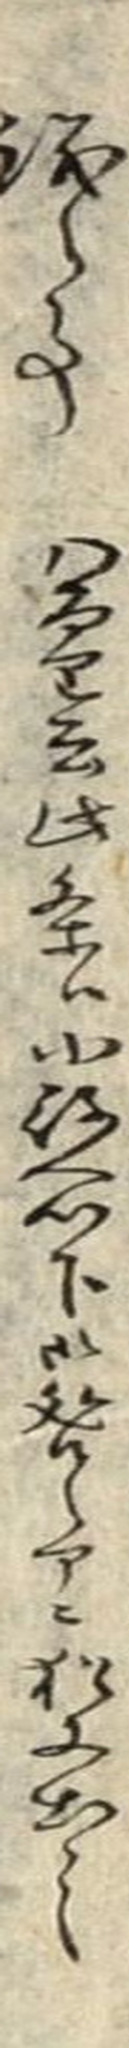議之事八百里言此条は小役人以下御咎之部に猶又出之
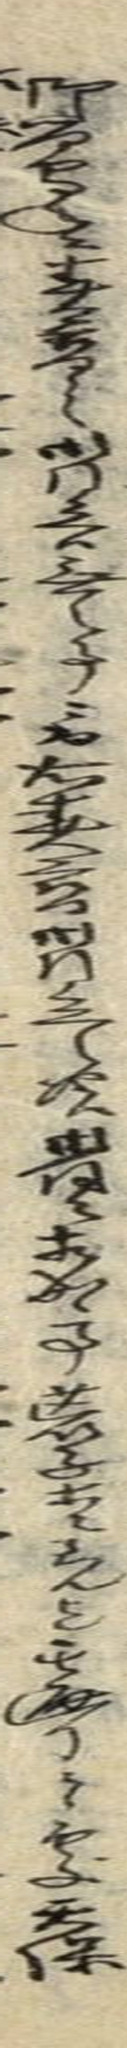御留守年に春暮之御引立は無之事に而右春暮御引立之儀は御伺に相成候事荒子等に至ル迄其通りに候処天保
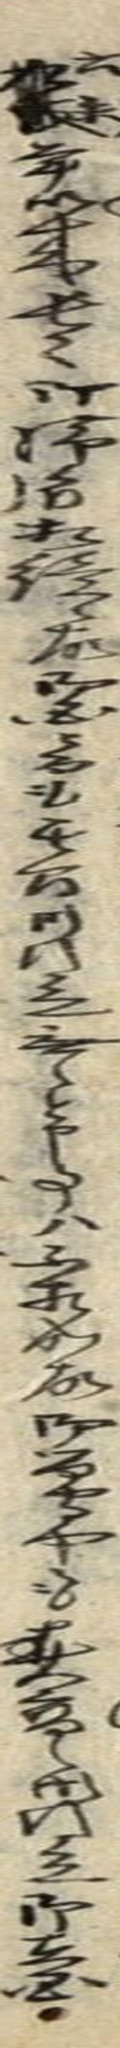六未年以来長々御滞府相続候故御国に而も其間御引立無之と申事は不相成候故御留守中にも春暮之御引立御在国
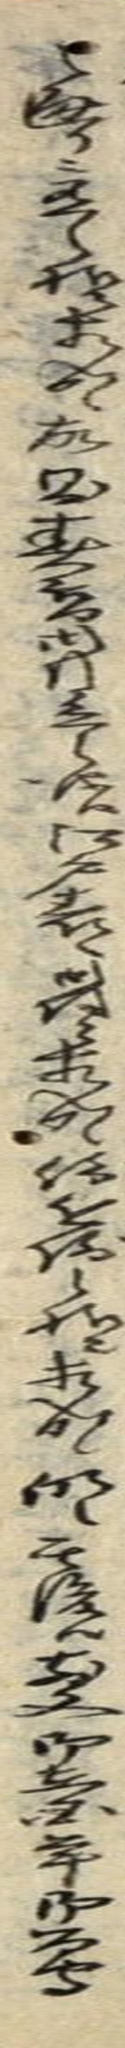之通りに有之様に相成候故則春暮御引立之儀は江戸表へ御伺に相成候儀近例之様に相成候仍之其後は前文御在国年御留守

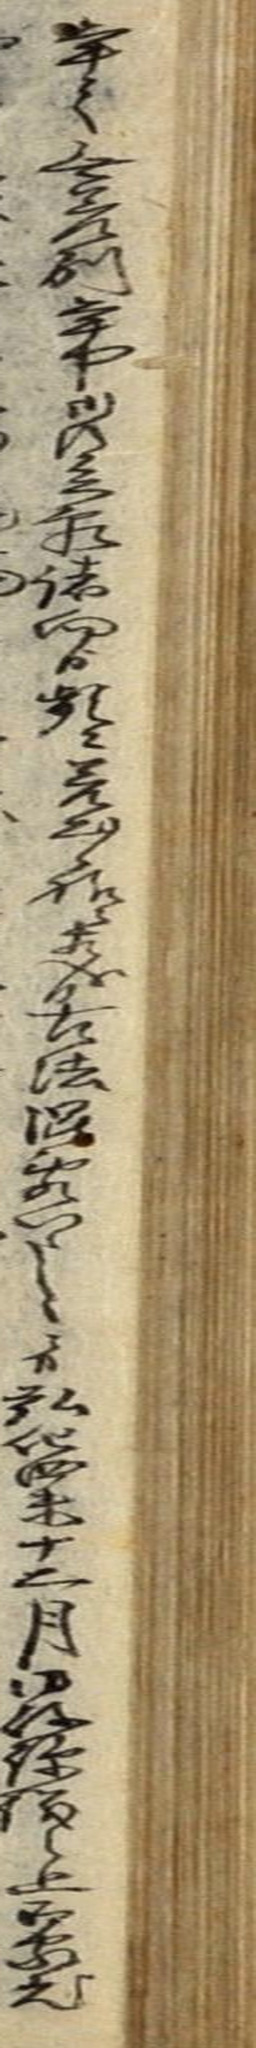年之無差別年中御引立願諸向ゟ頻に差出候様に相成古法混乱いたし候に付弘化四未十二月同役評議之上御家老
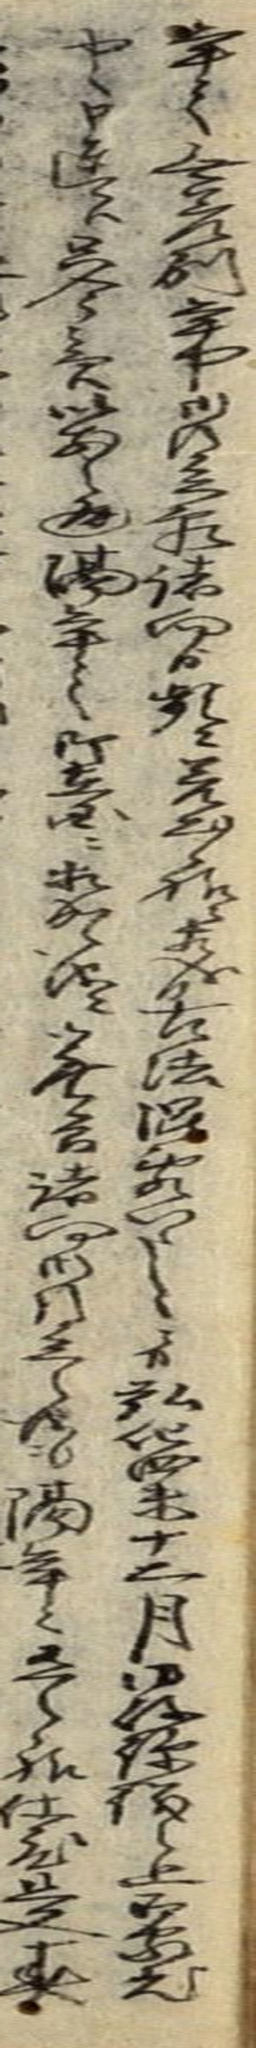中へ申達候は只今に而は以前之通隔年之御在国に相成候儀に御座候間諸向御引立之儀も隔年に有之候様仕度且又春
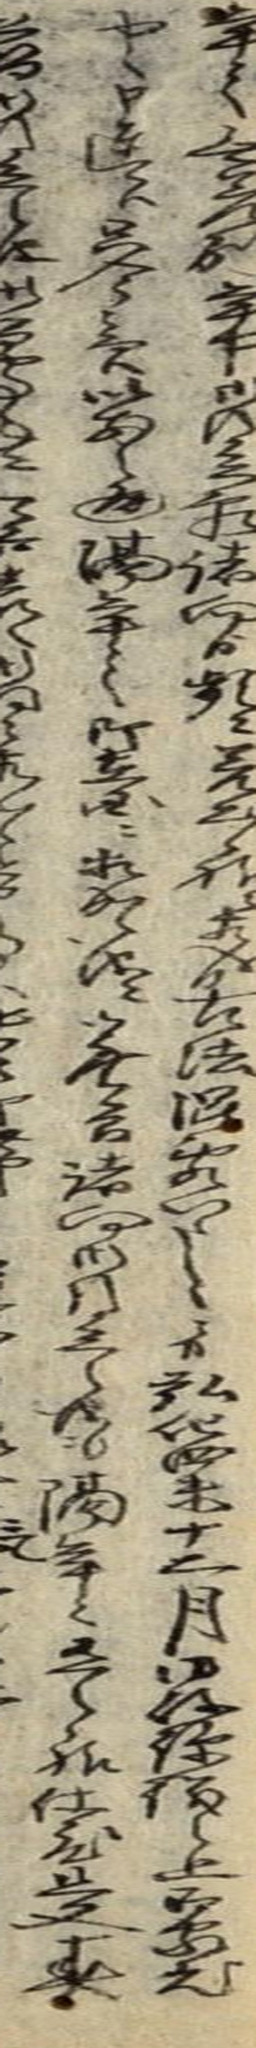中へ申達候は只今に而は以前之通隔年之御在国に相成候儀に御座候間諸向御引立之儀も隔年に有之候様仕度且又春
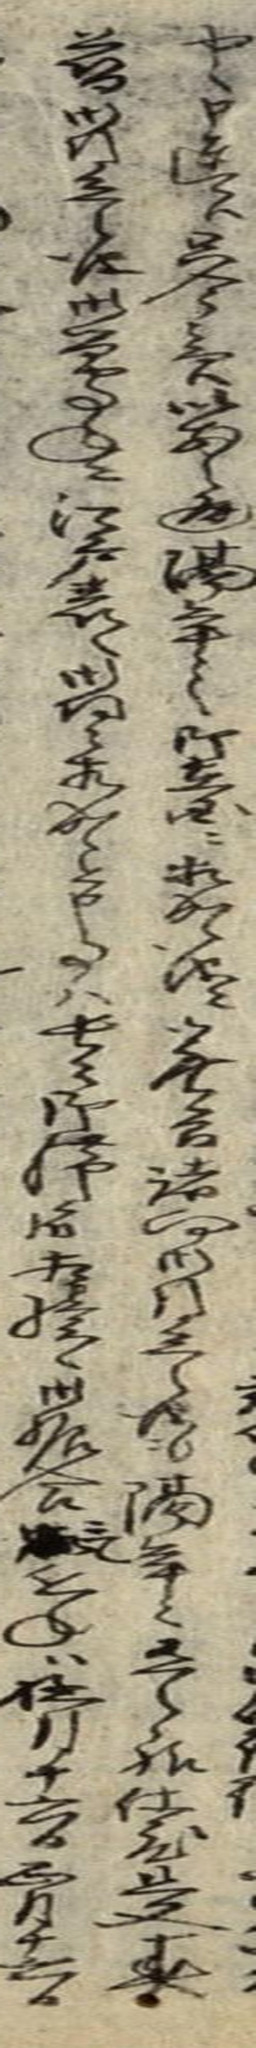暮御引立之儀御留守年に江戸表へ御伺に相成候と申事は長々御滞府相続候御振合にて近年は極月十六日正月十六日
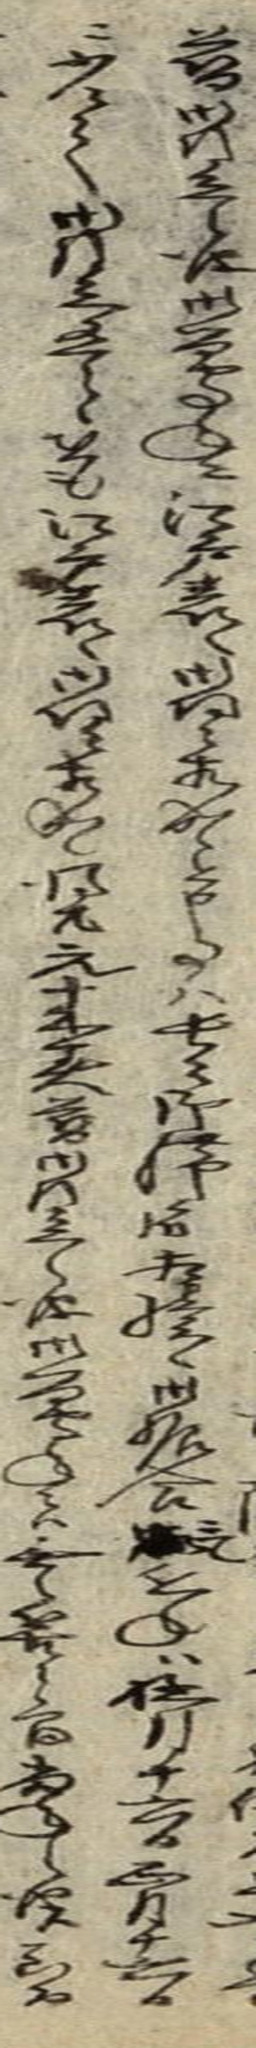に少々之御引立有之をも江戸表へ御伺に相成候得共元来春暮御引立之儀御留守年には無之筈に候間当年之儀は至而
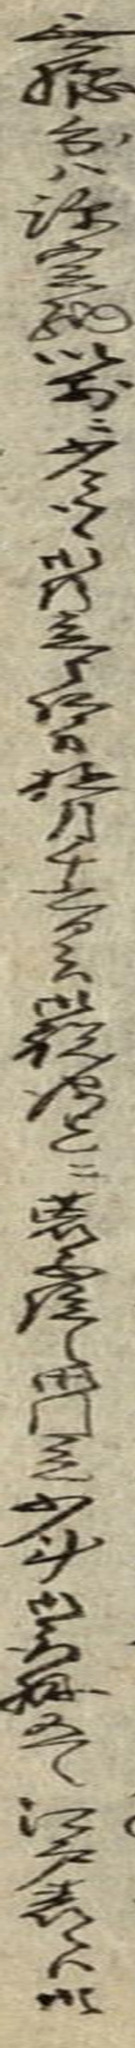無拠分は評定納以前に少々つゝ御引立被仰付極月十六日には御祝儀迄に荒子之御引立少斗御取扱有之江戸表へは御
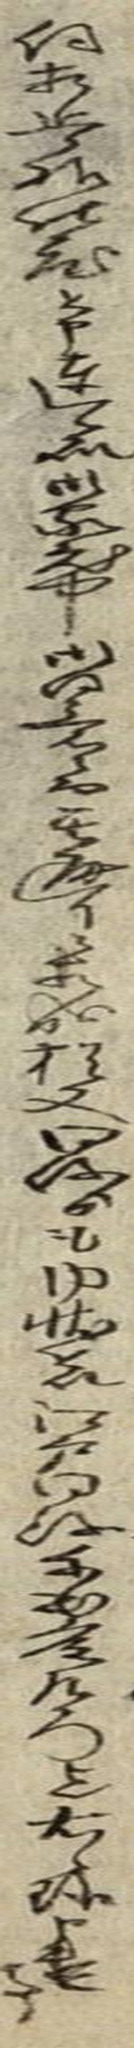伺相止候様仕度と申達候処御家老中御同意に而其通りに相成猶又同役ゟも内状を以江戸同役千本藤左衛門迄右之趣申遣候事
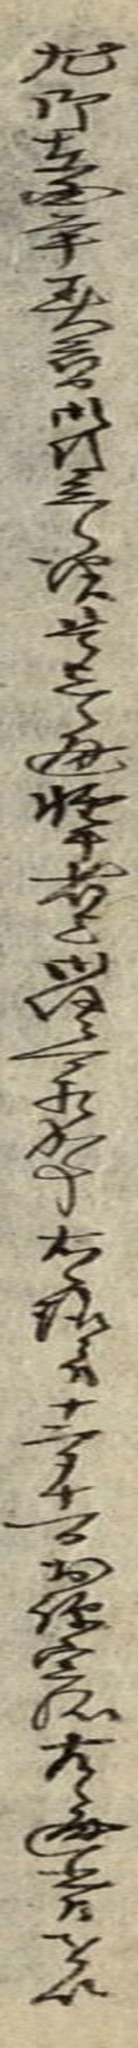尤御在国年春暮御引立之儀は是迄之通軽き者迄御伺に可相成事右之趣に付十二月十一日於評定所左之通書付を以
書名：御用并被仰出之部
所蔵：福井県文書館 Fukui Prefectural Archives
